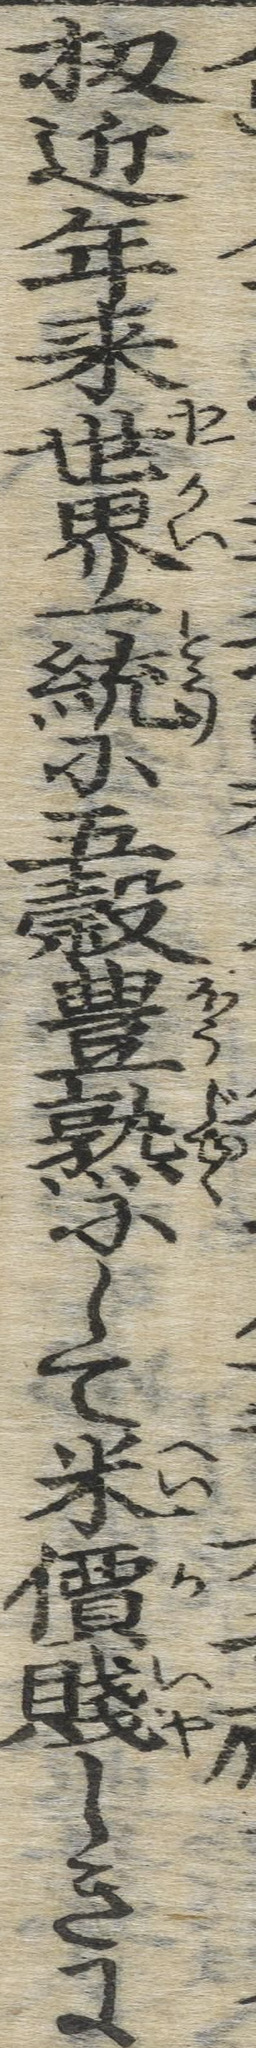扨近年来世界一統に五穀豊熟にして米価賤しきに
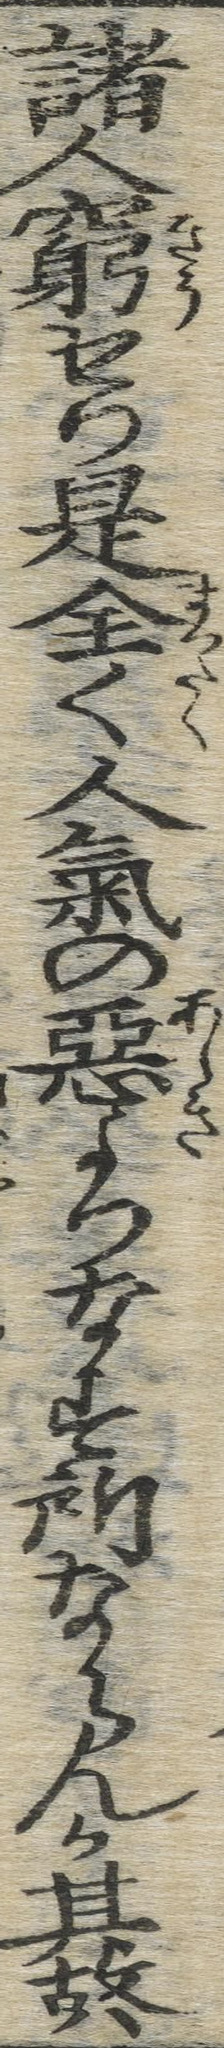諸人窮せり是全く人気の悪よりなす所ならんか其故は
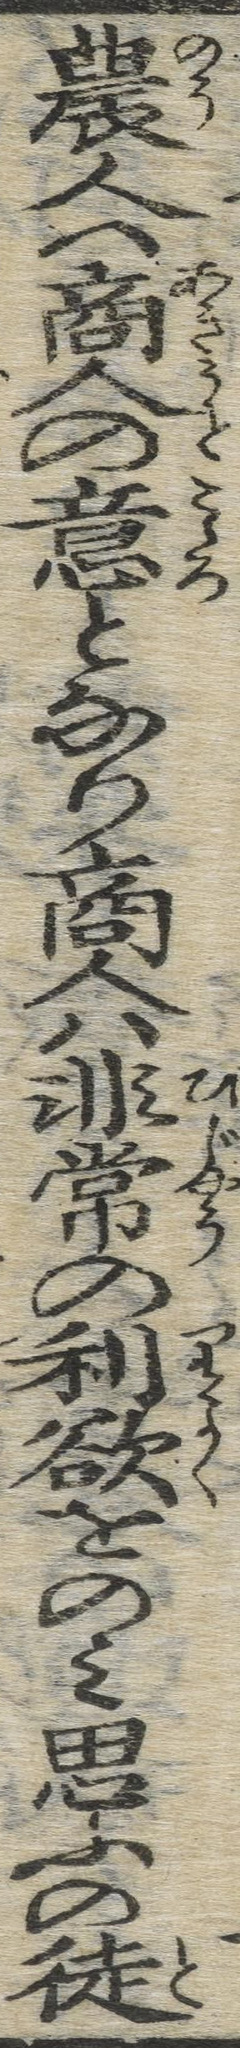農人は商人の意となり商人は非常の利欲をのみ思ふの徒
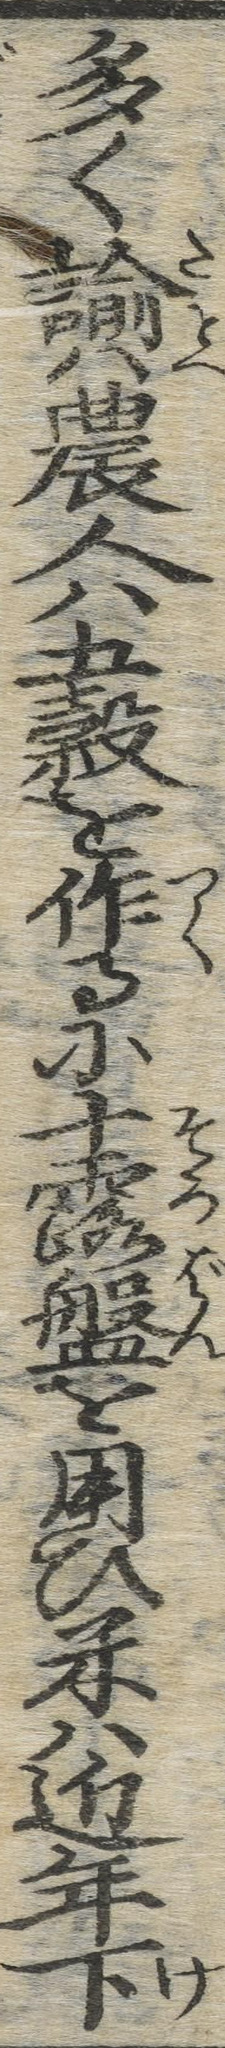多く諭は農人は五穀を作るに十露盤を用ひ米は近年下
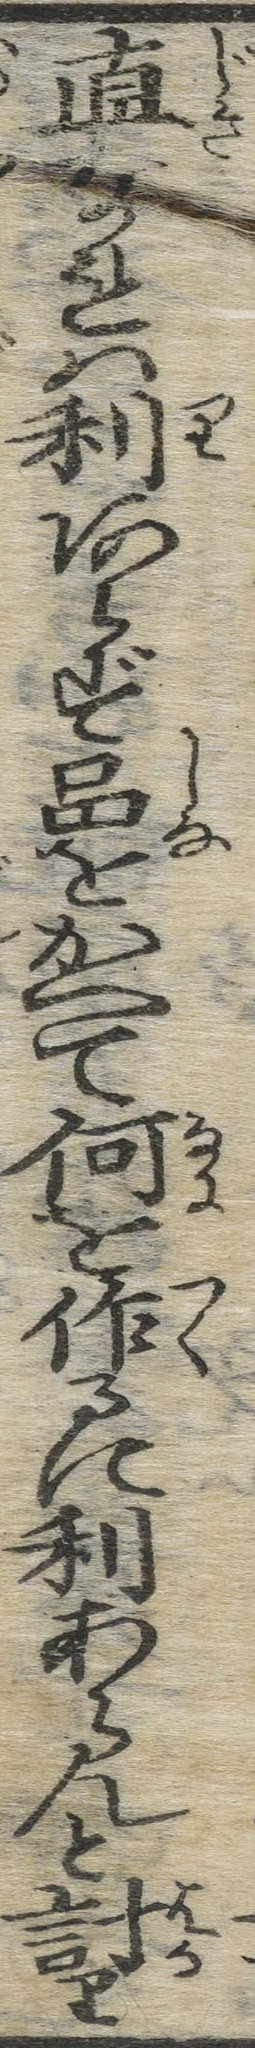直なれは利あらず品をかへて何を作るに利あらんと計り
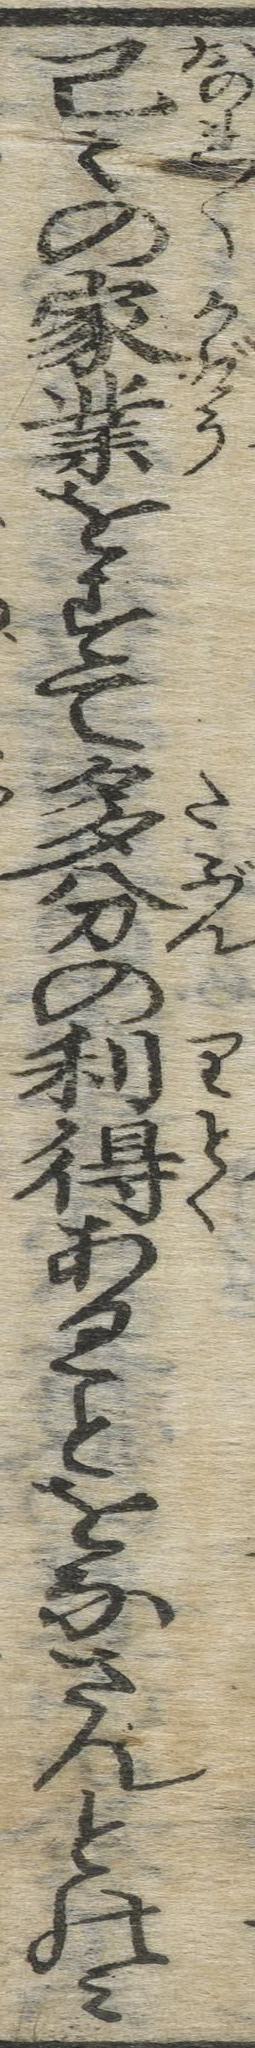己〻の家業をすて多分の利得あることをなさんとそ
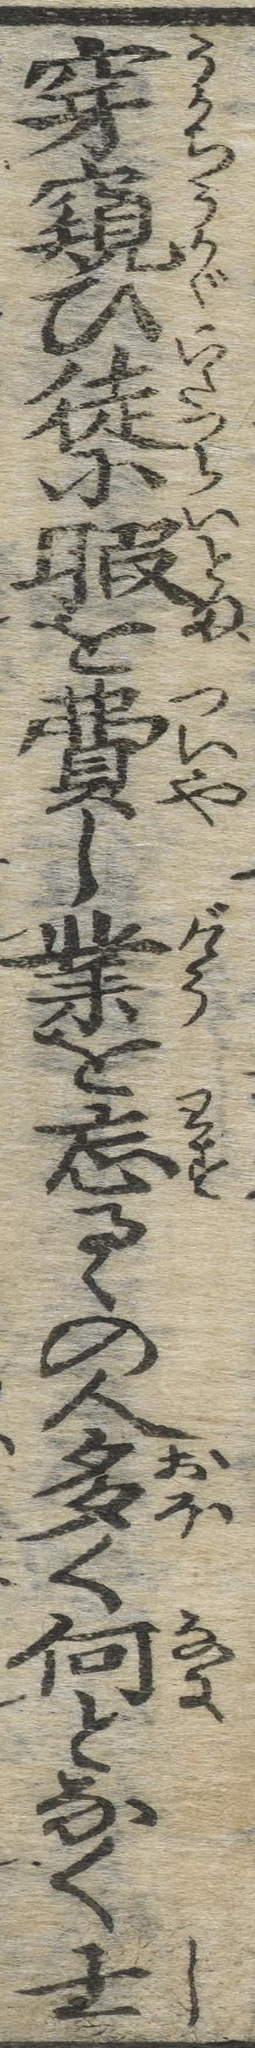穿窺ひ徒に暇を費し業を忘る〻の人多く何となく士
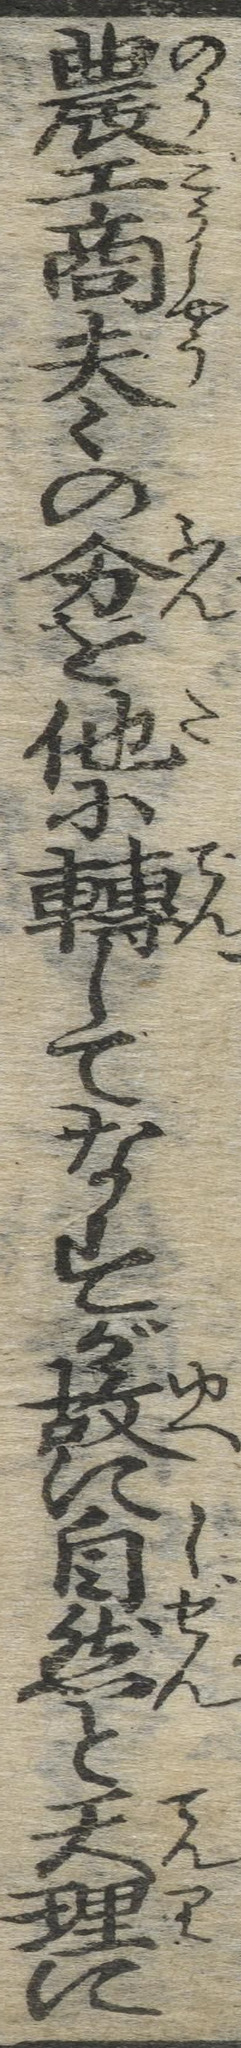農工商夫〻の分を他に轉してなすが故に自然と天理に

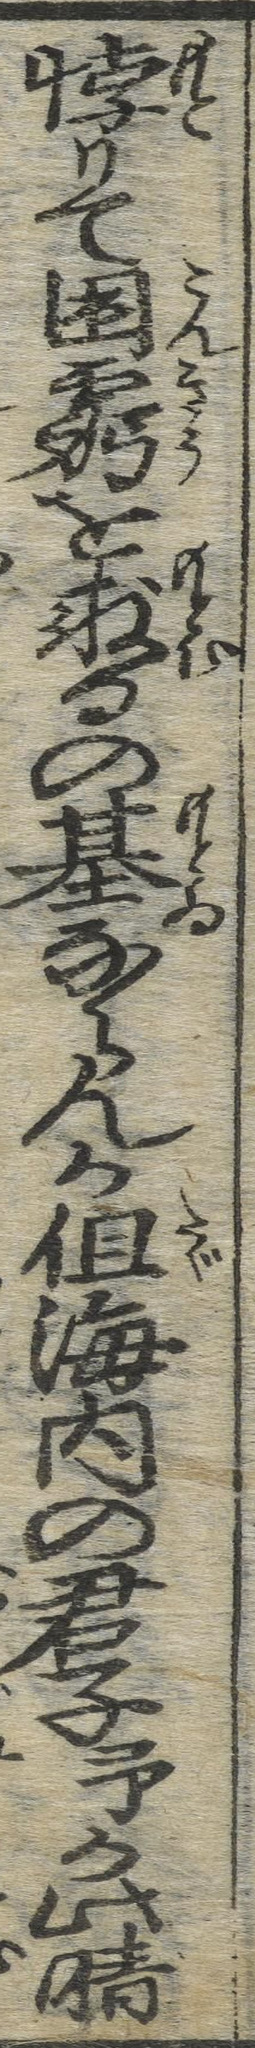悖りて困窮を求るの基ならんか伹海内の君子予か此晴
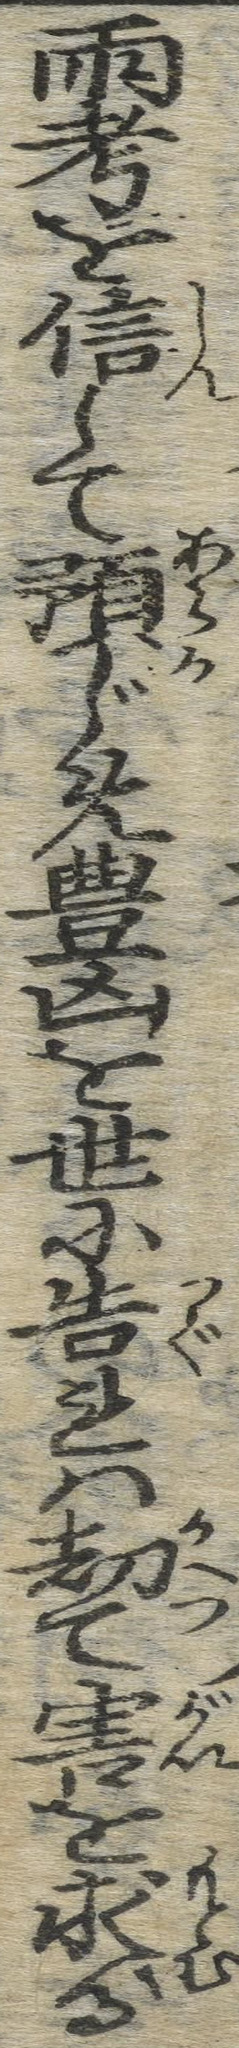雨考を信して預じめ豊凶を世に告れは劫て害を求る
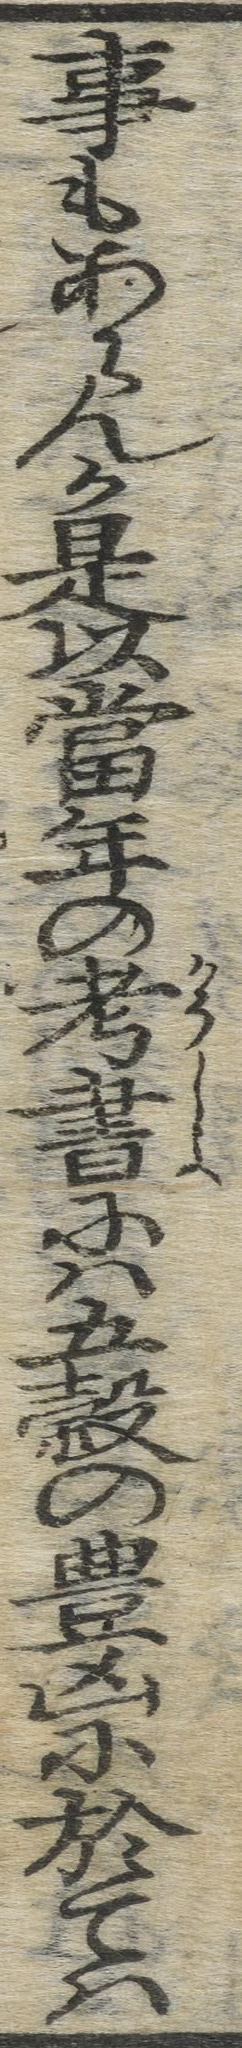事もあらんか是以當年の考書には五穀の豊凶に於ては
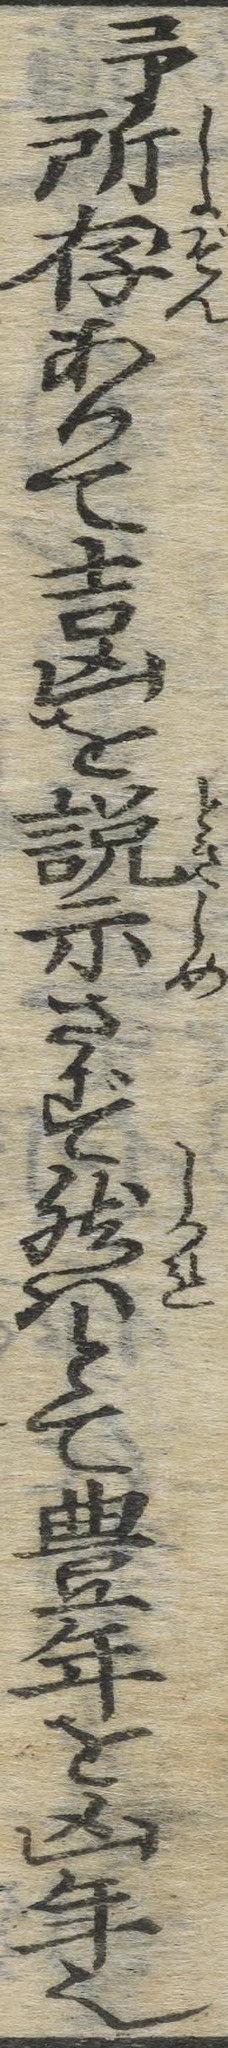予所存ありて吉凶を説示さず然はとて豊年を凶年也
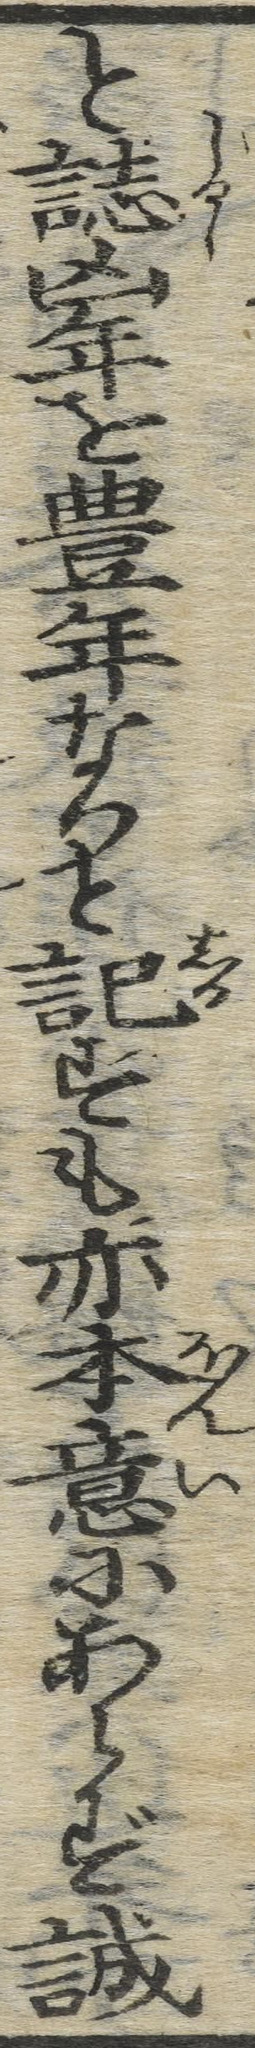と誌凶年を豊年なりと記すも亦本意にあらず誠
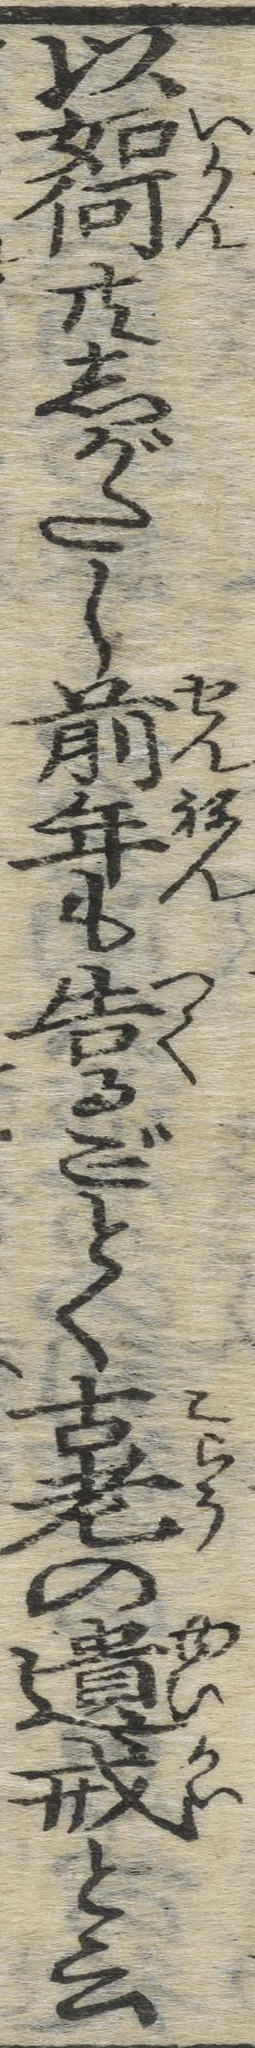以如何共しがたし前年も告るごとく古老の遺戒と云
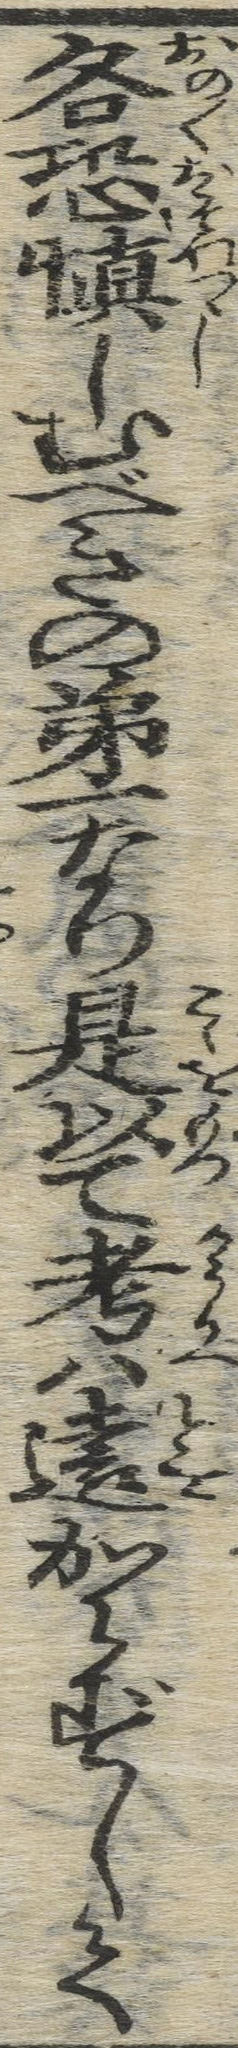各恐慎しむべきの弟一なり是以て考は遠からずして
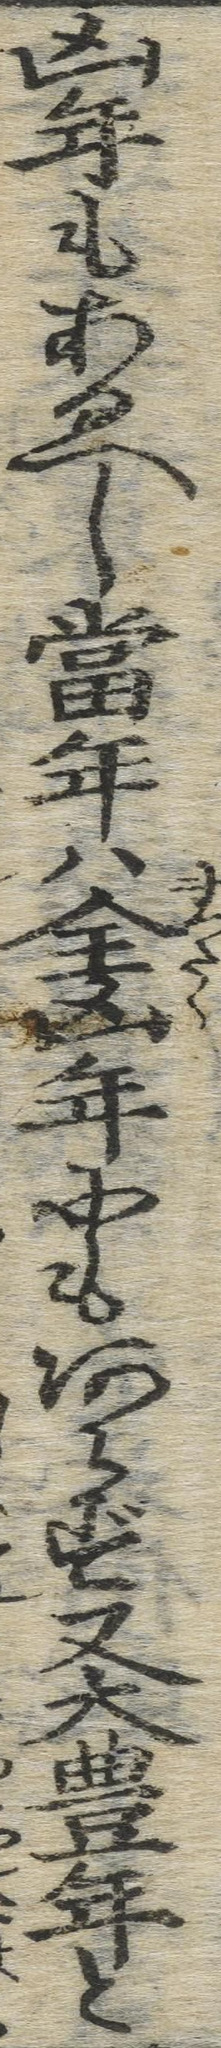凶年もあるへし當年は全凶年中もあらず又大豊年と
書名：[晴雨考]
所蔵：東京大学地震研究所図書室 Earthquake Research Institute Library, The University of Tokyo, JAPAN
